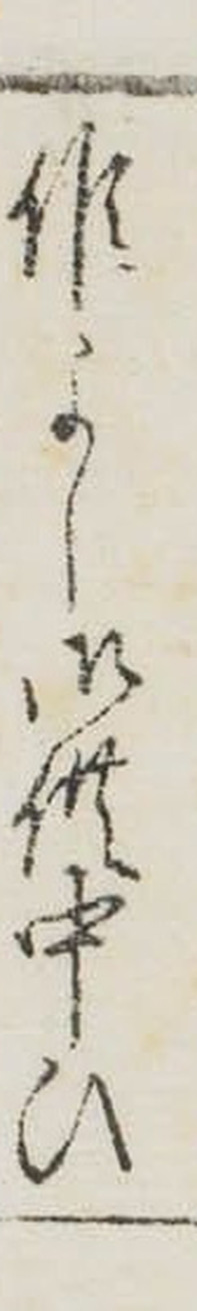候よし御供中ひ
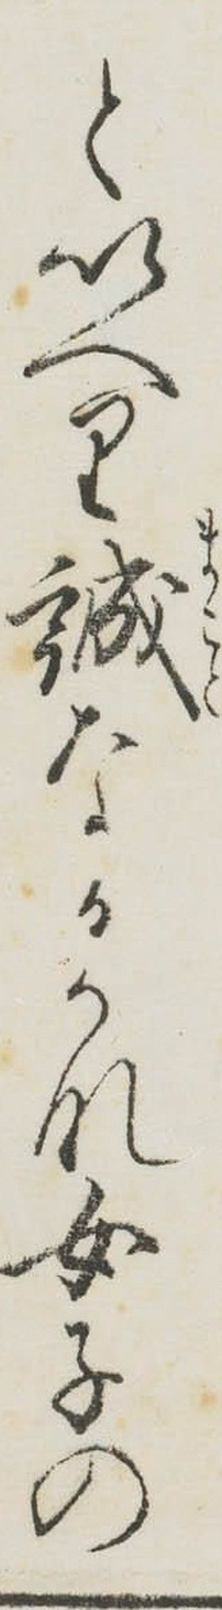といへり誠なるかな女子の
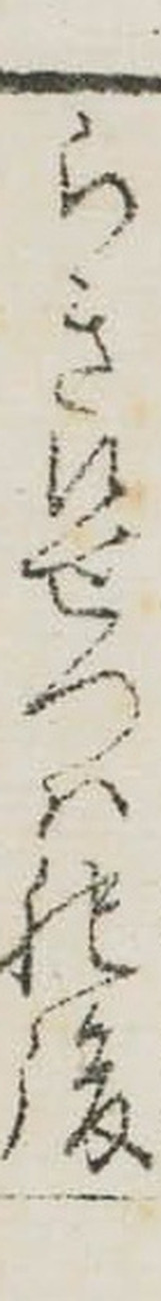らき候せつは肥後
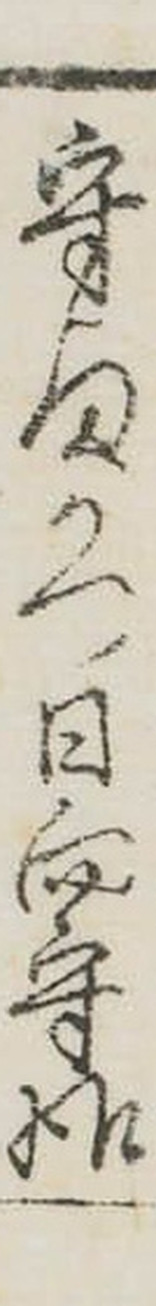守さまかつ日向守様
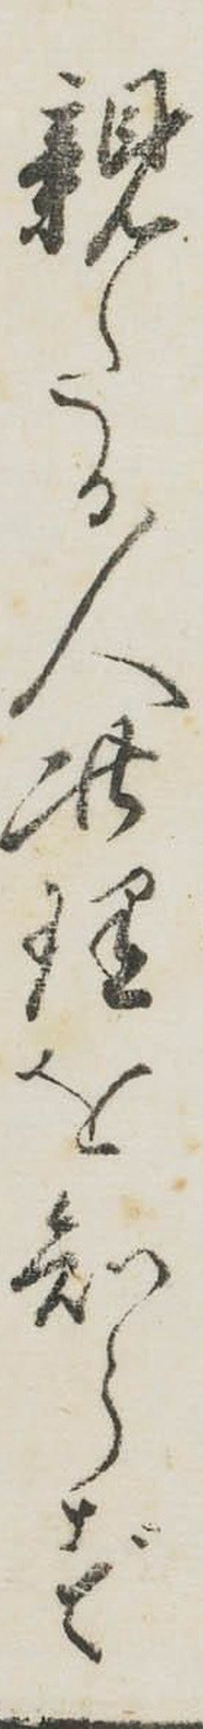親たる人此理を知らず
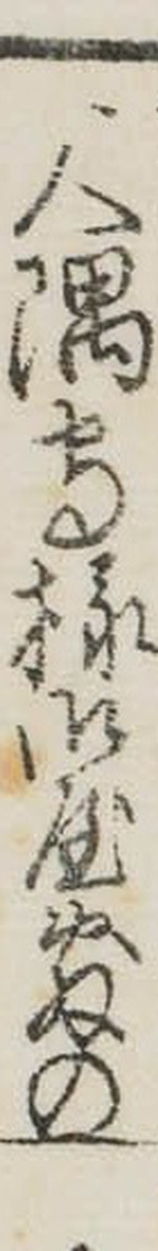大隅守様御屋敷の
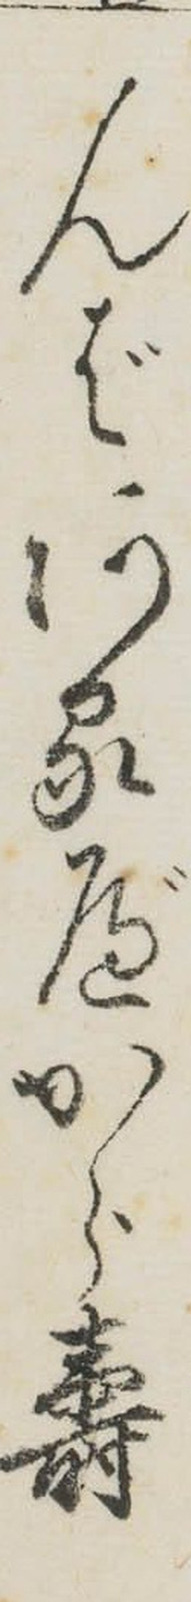んばあるべから壽
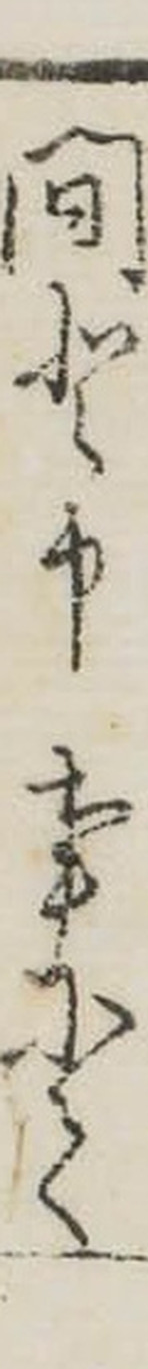間と申す事にて
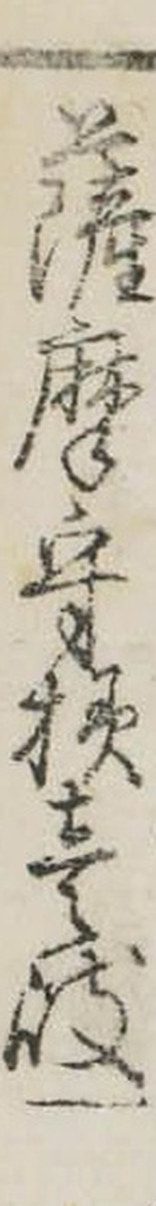薩摩守様壱岐
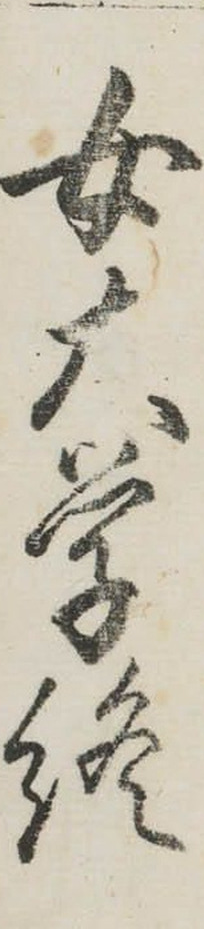女大学終

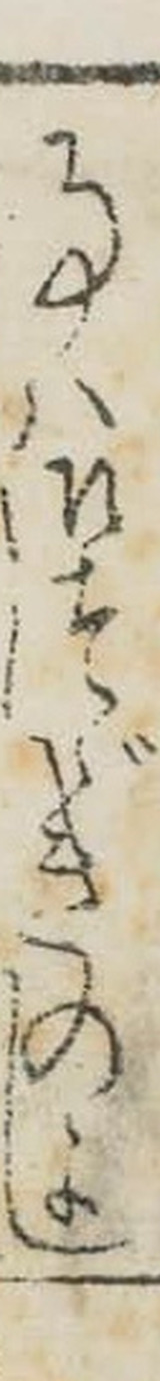事は御つゞきのよし
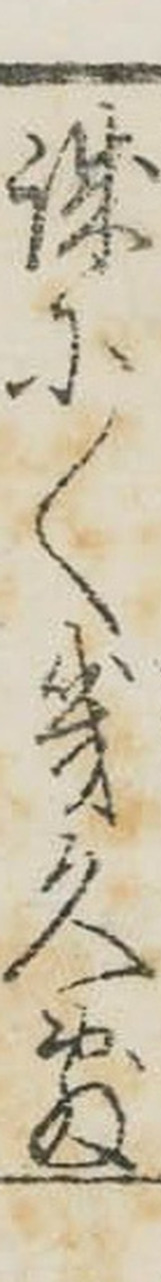誠に〳〵幾久敷
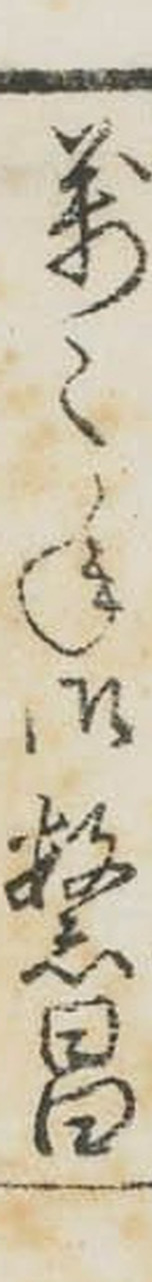萬々年御繁昌
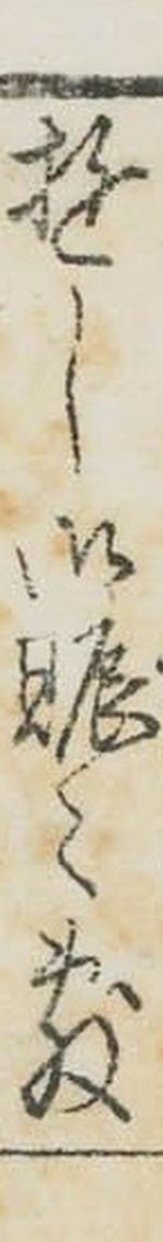遊し御賑々敷
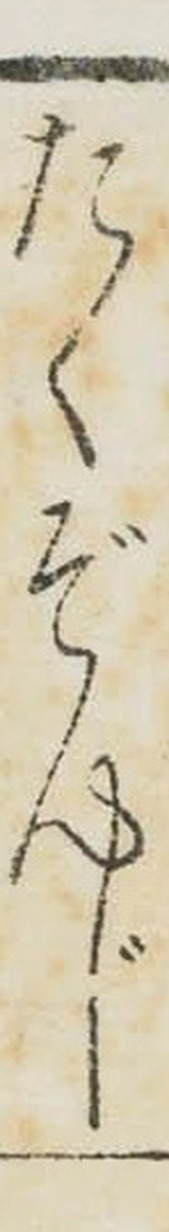たくぞんじ
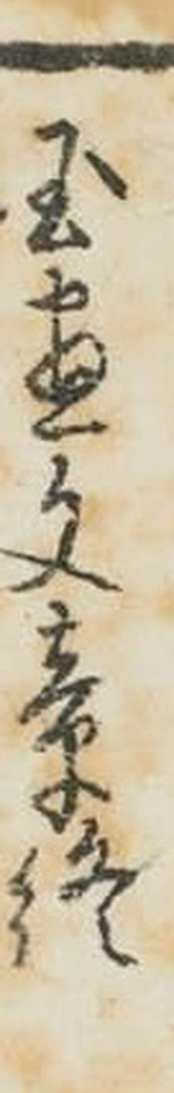国盡文章終
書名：女大学
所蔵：東京学芸大学教育コンテンツアーカイブ
